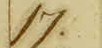17.
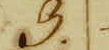3.
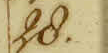28.
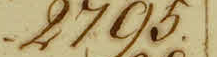2795.
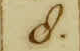8.
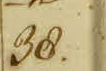38.
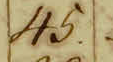45.
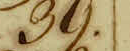39.
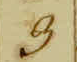3.
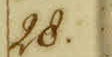28.
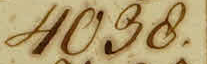4058.
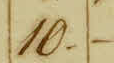10.
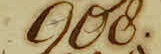908.
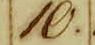10.
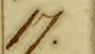17.
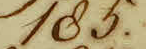185.
